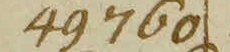49760
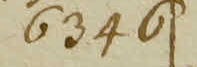6346
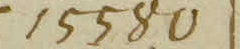15580
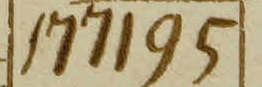177195
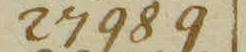27989
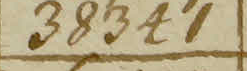38341
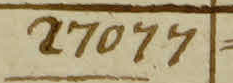27077
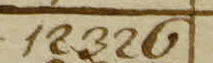12326
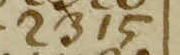2315
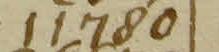11780
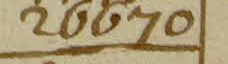26670
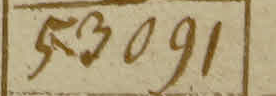53091
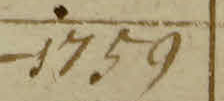1759
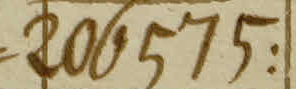206575
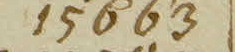15663
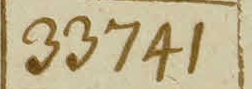33741
